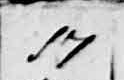17
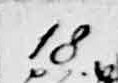18
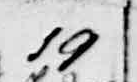19
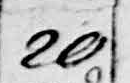20
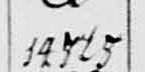14525
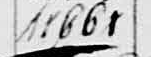11661
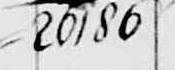26186
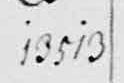13513
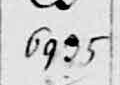6935
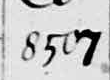8507
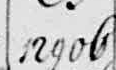12906
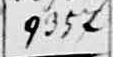9352
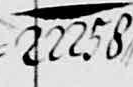22258
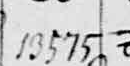13575
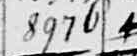8976
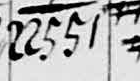22551
